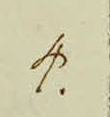4.
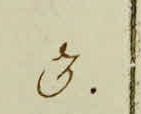3.
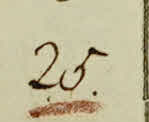25.
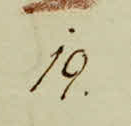19.
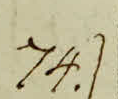74.
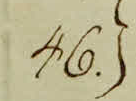46.
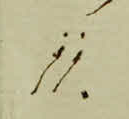11.
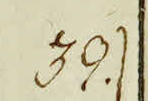39.
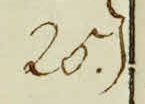25.
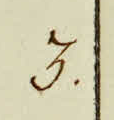3.
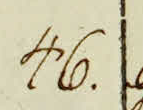46.
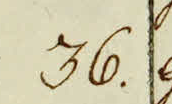36.
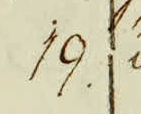19.
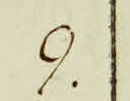9.
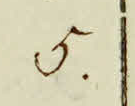5.
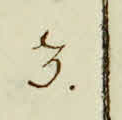3.
